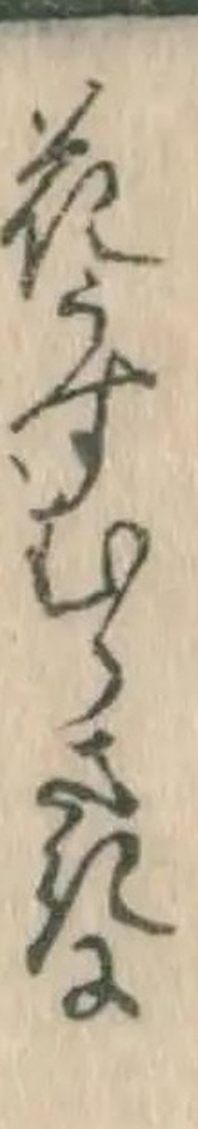花うすむらさきに
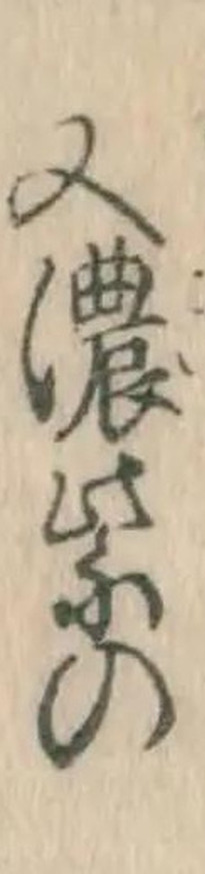又濃紫の
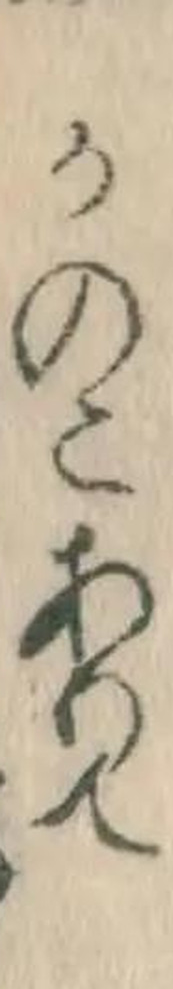かのこありて
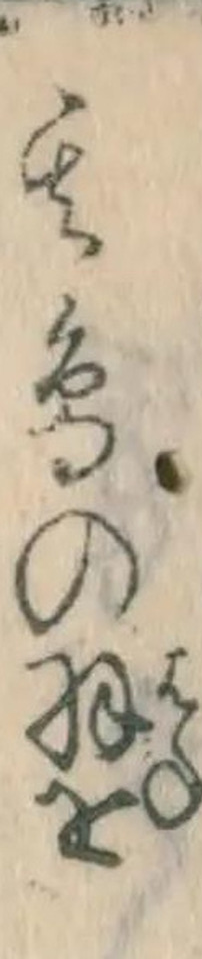其鳥の羽を
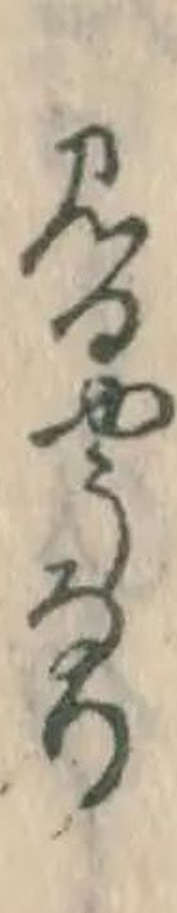見るやうなり
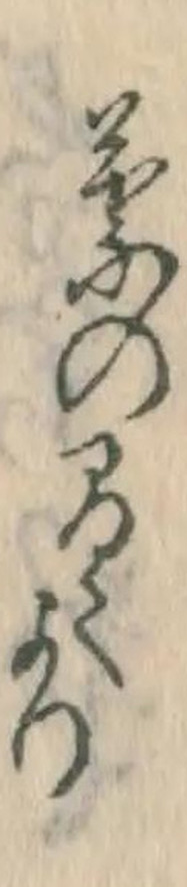葉の間々より
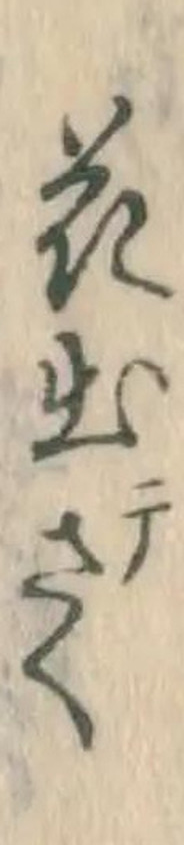花出てさく
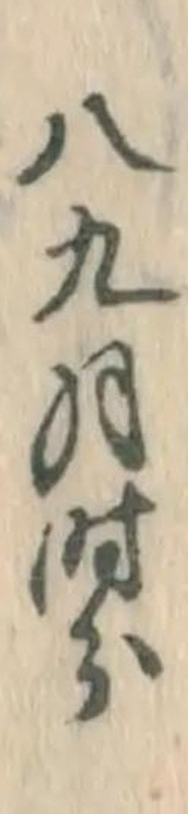八九月時分

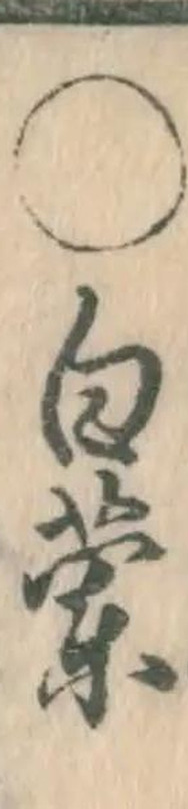〇白蘭
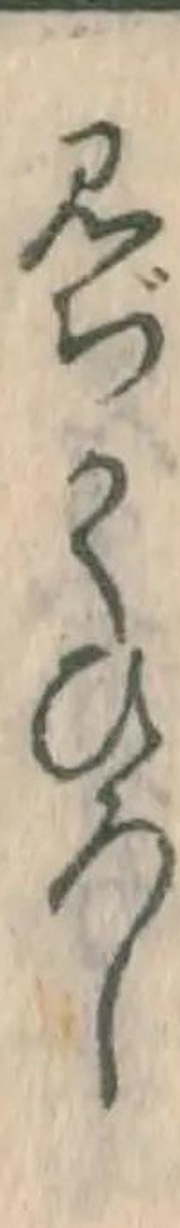みぢかくひろし
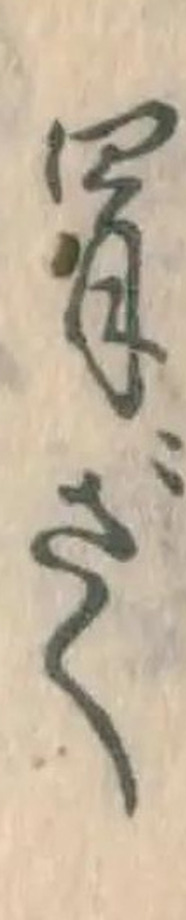四月にさく
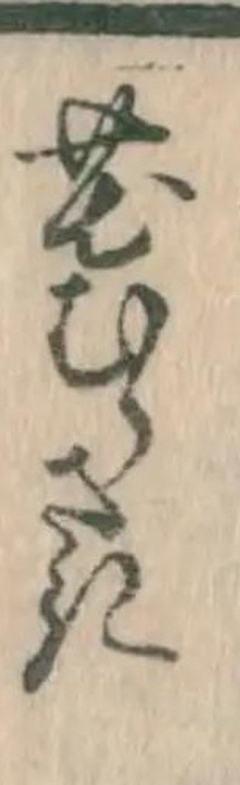花むらさき
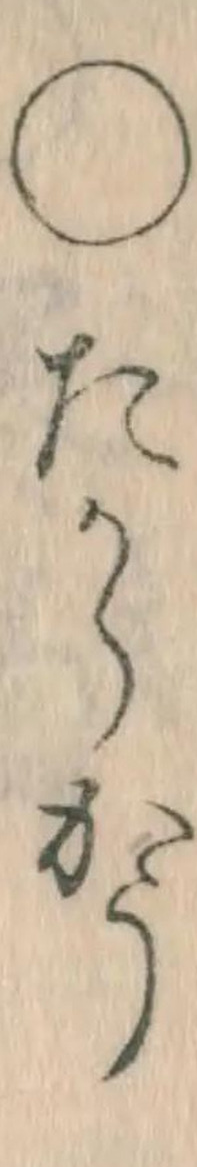〇たからかう
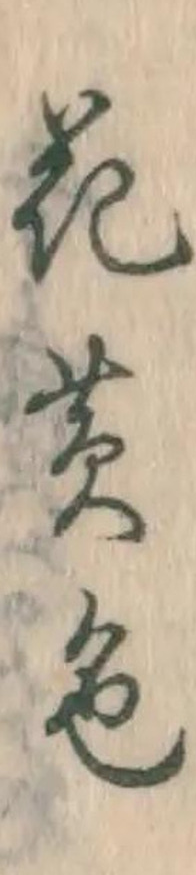花黄色
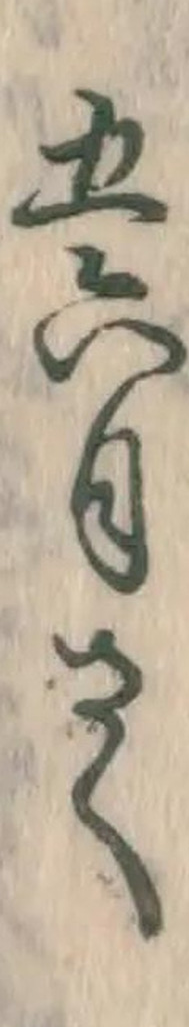五六月さく

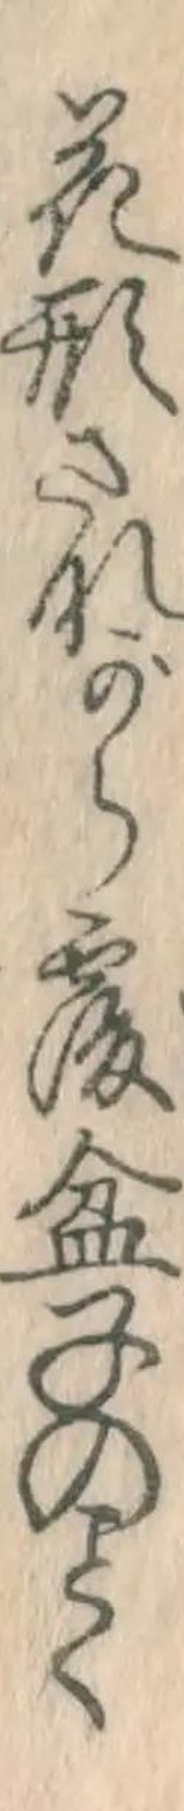花形さながらい覆盆子のことく
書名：艸花繪前集. [3]
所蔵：国立国会図書館 National Diet Library, JAPAN
